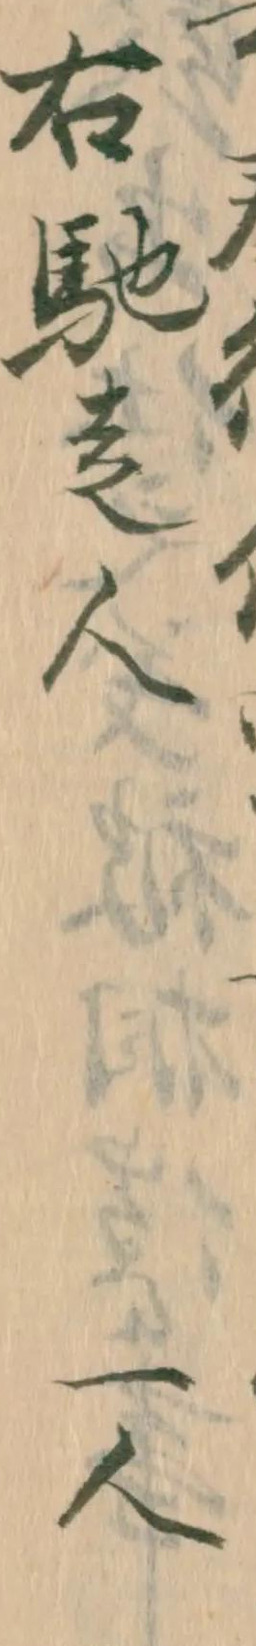右馳走人一人
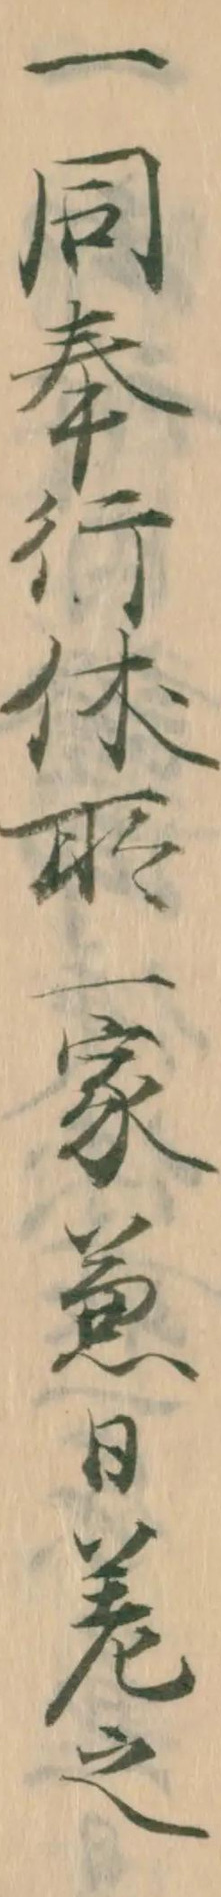一同奉行休所一家兼日差之
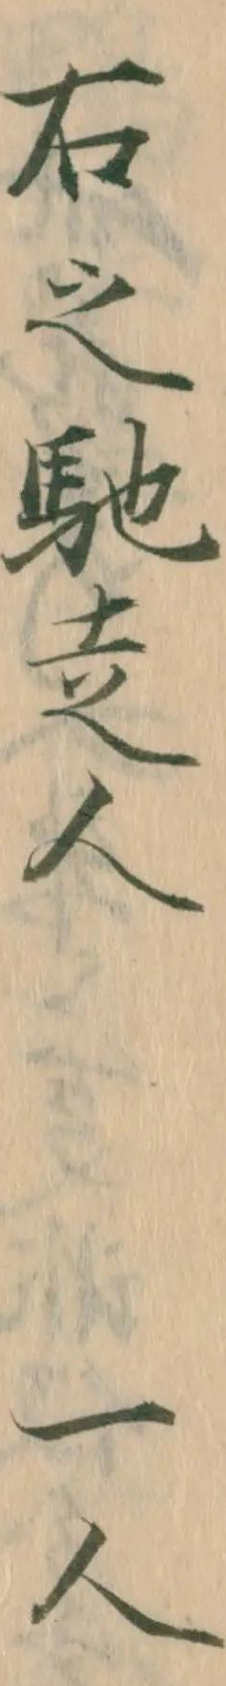右之馳走人一人
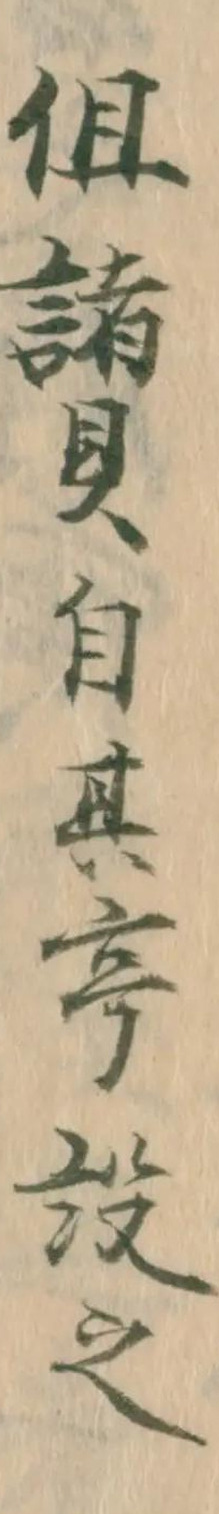但諸具自其亭設之
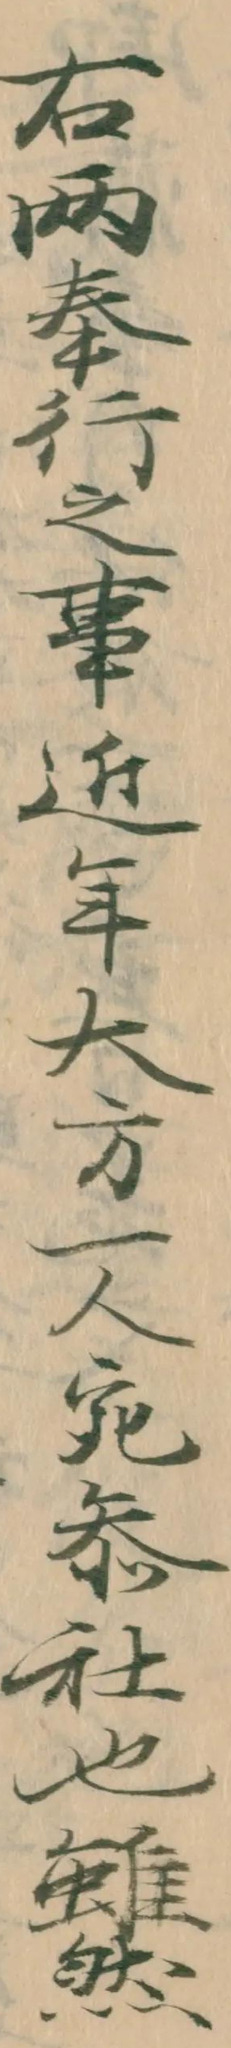右両奉行之事近年大方一人宛参社也雖然
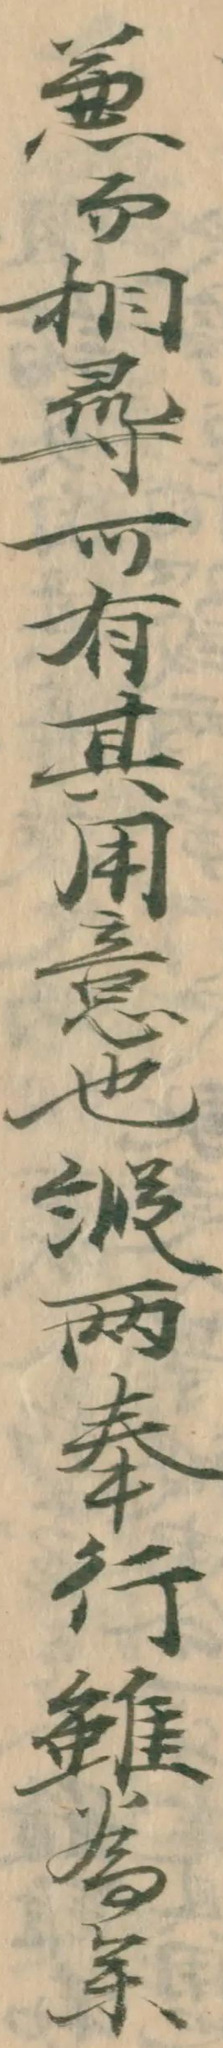兼而相尋可有其用意也縦両奉行雖為参
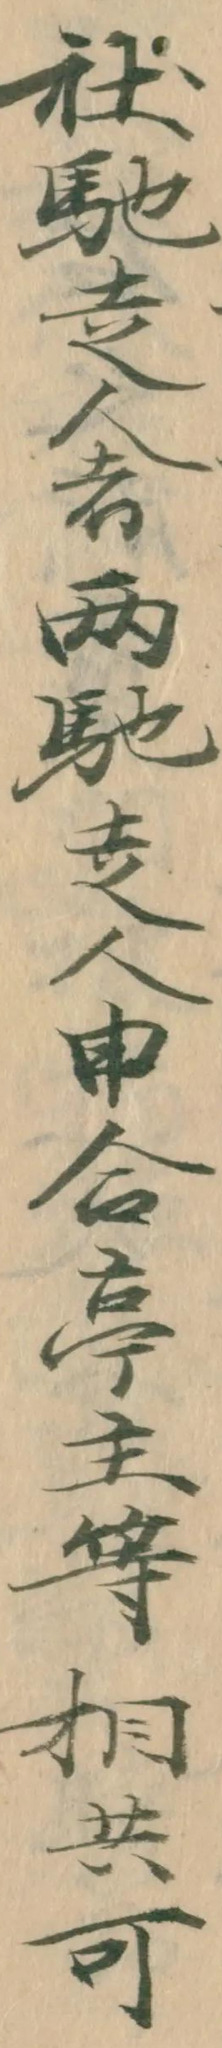社馳走人者両馳走人申合亭主等相共可
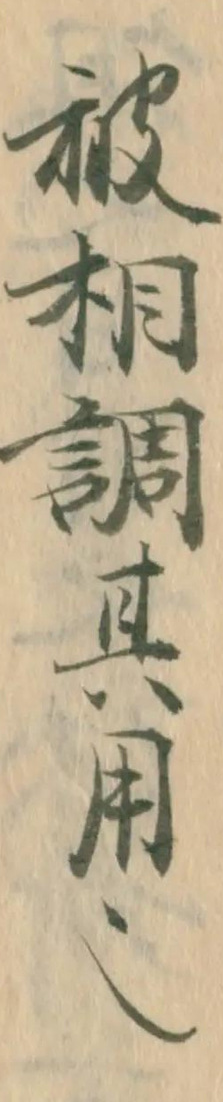被相調其用也

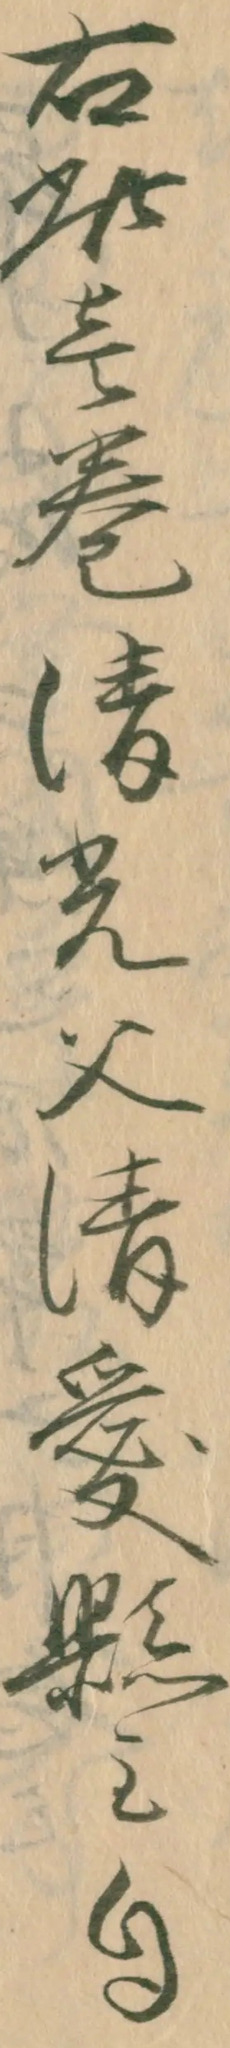右此壱巻清光父清愛県主自
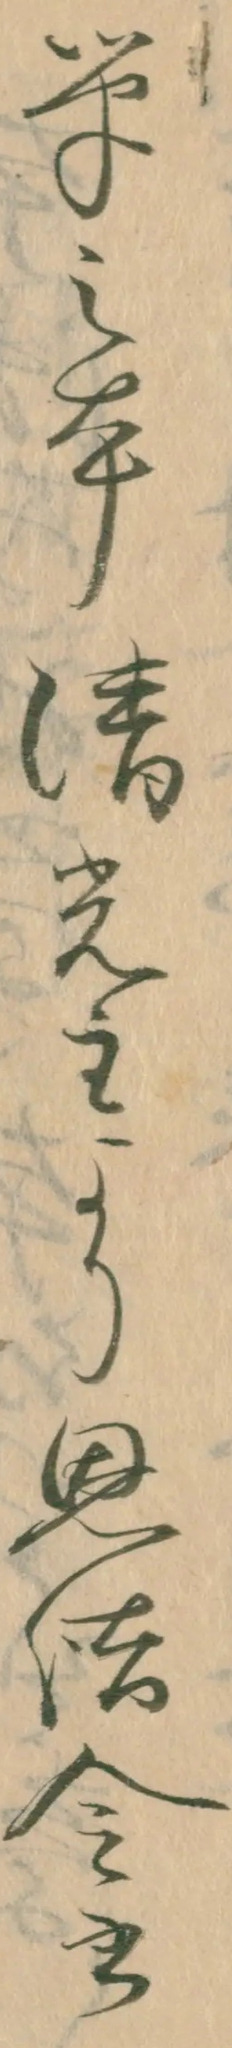筆之本清光主より恩借令書
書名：賀茂社記録. 第6冊
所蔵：国立国会図書館 National Diet Library, JAPAN
